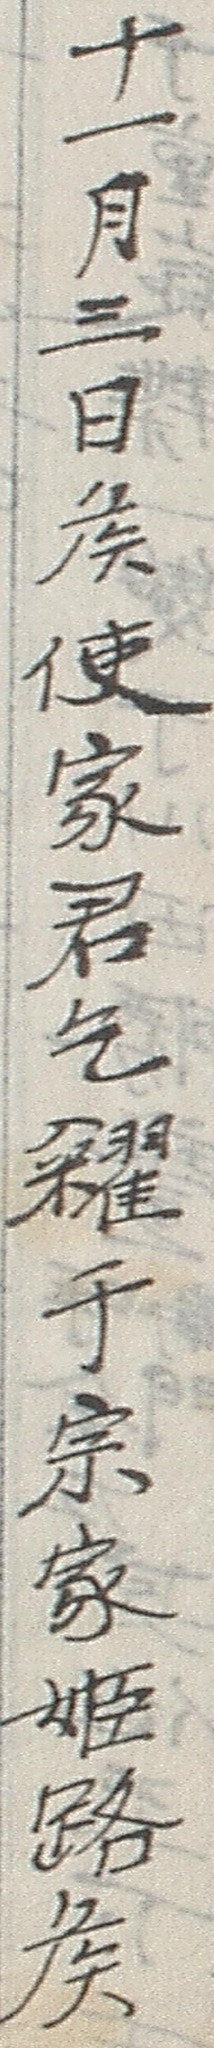十一月三日矦使家君乞糴干宗家姫路矦
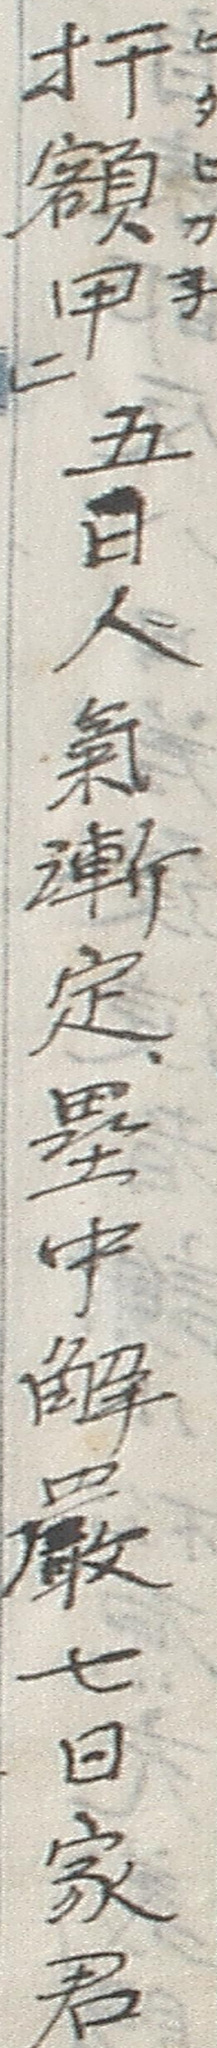扞額甲五日人気漸定塁中解厳七日家君

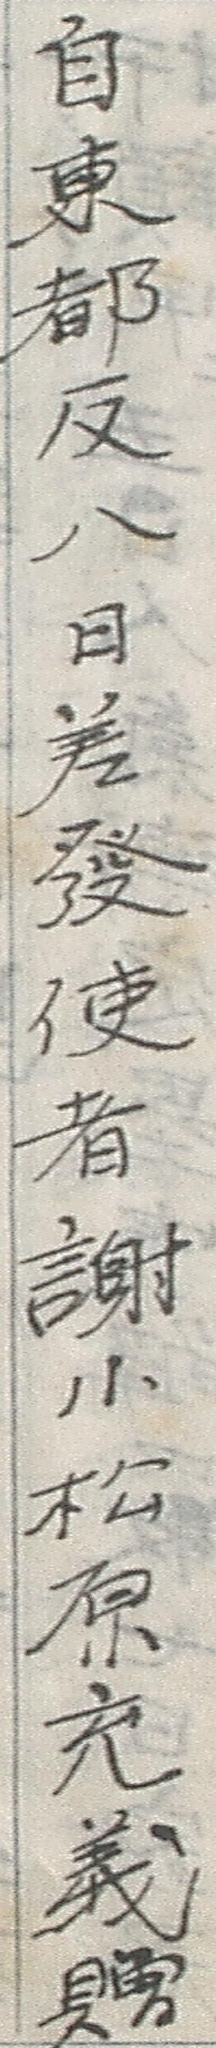自東都反八日差發使者謝小松原充義贈
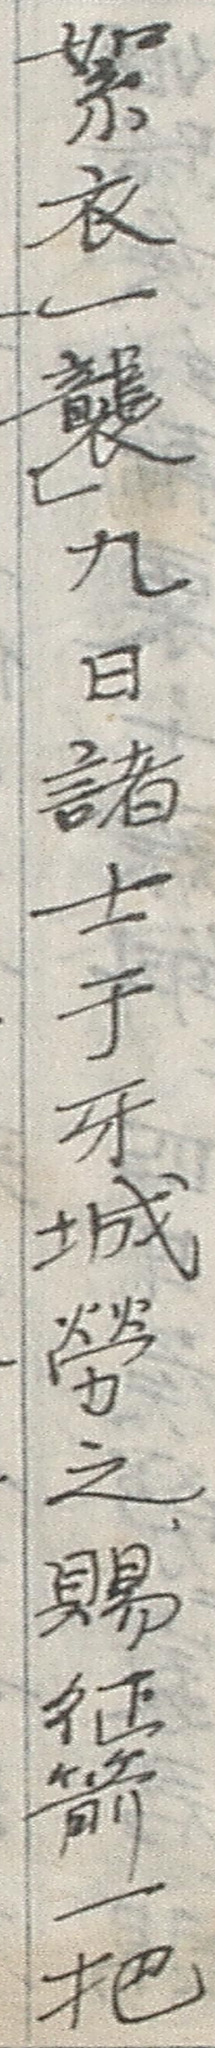絮衣一襲九日諸士干牙城勞之、賜征箭一把
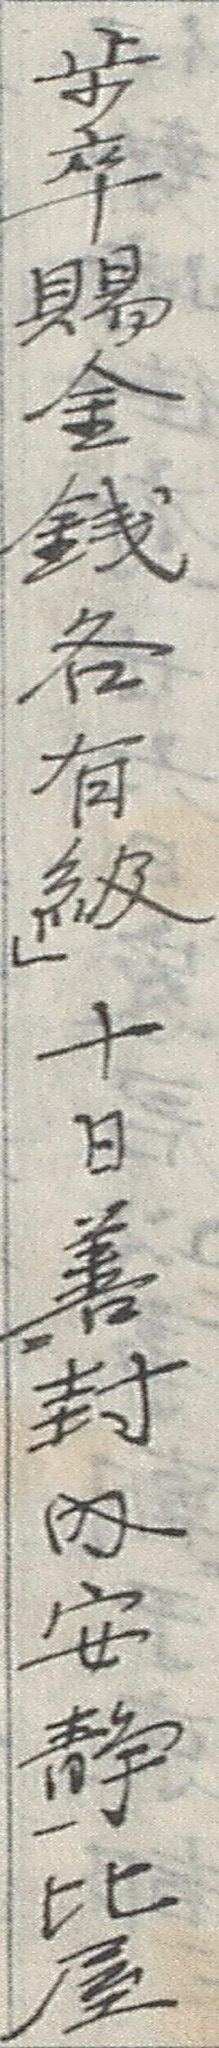歩卒賜金銭各有級十日善封内安静一比屋
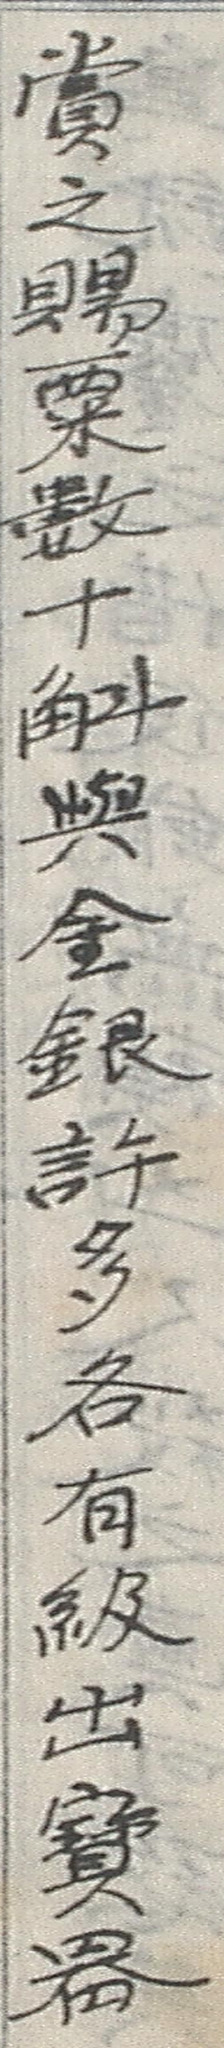賞之賜栗数十斛興金銀許多各有級出寳器

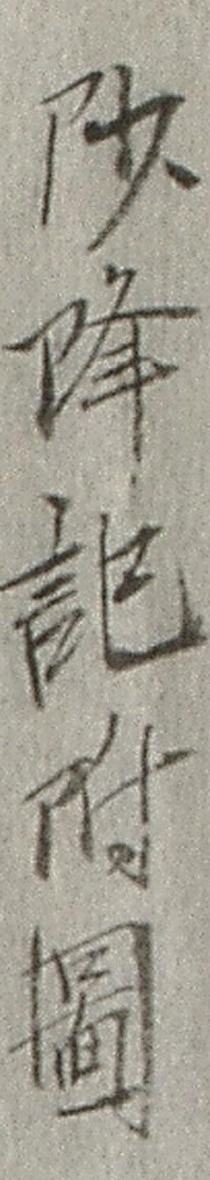沙降記附図
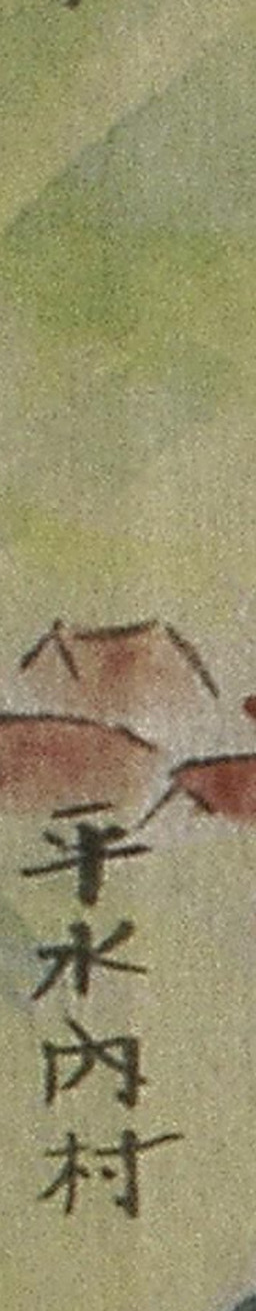平水内村
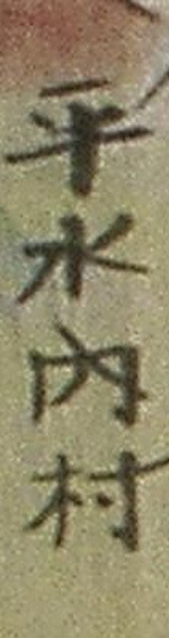平水内村
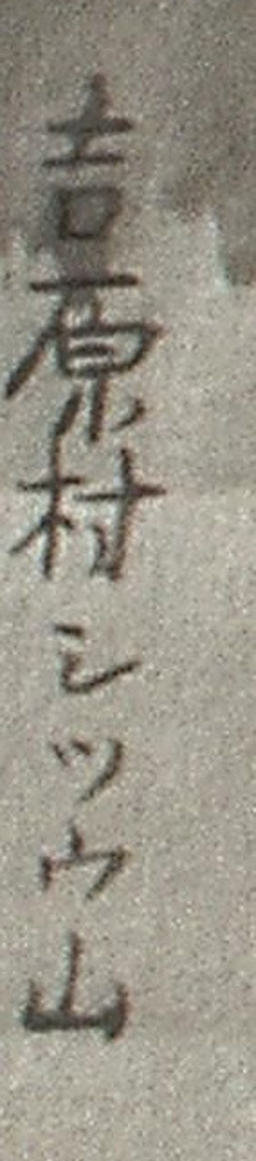吉原村シツウ山

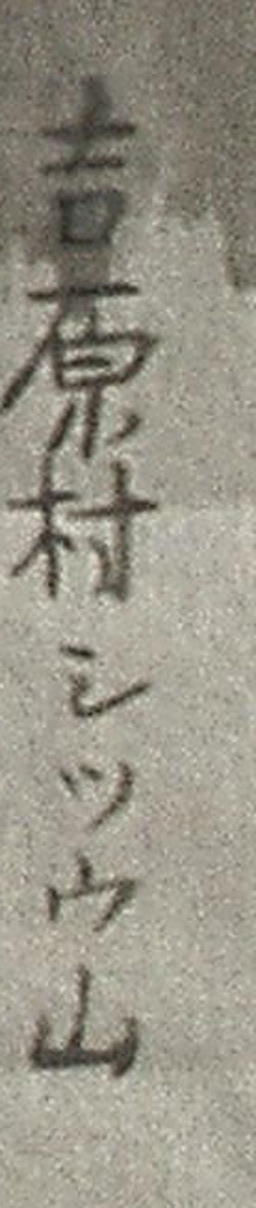吉原村シツウ山
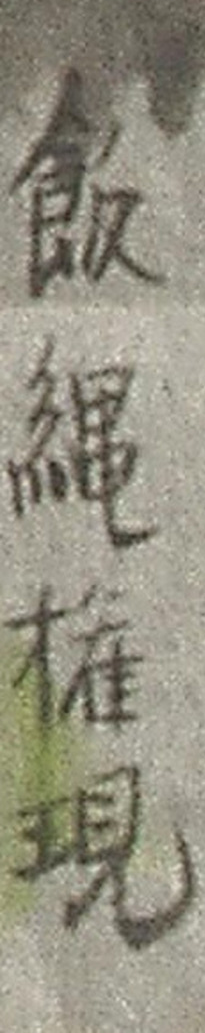飯縄権現
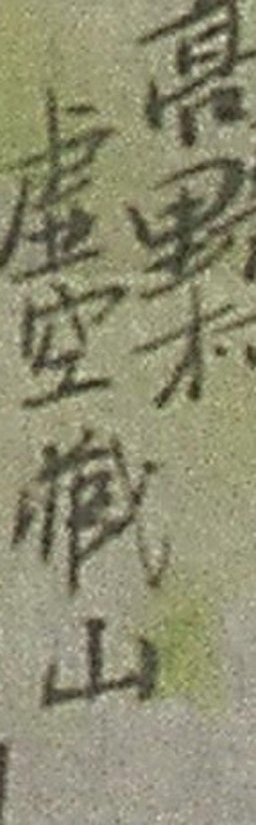虚空蔵山
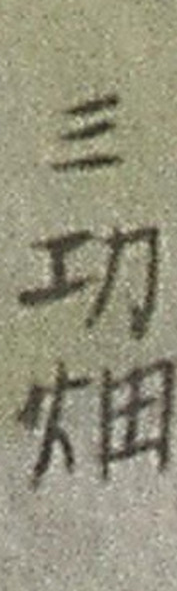三功畑
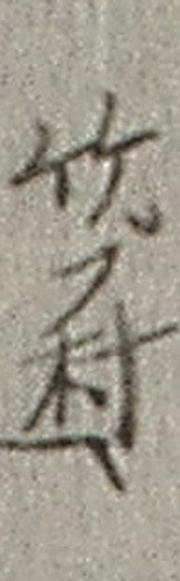竹ブ村
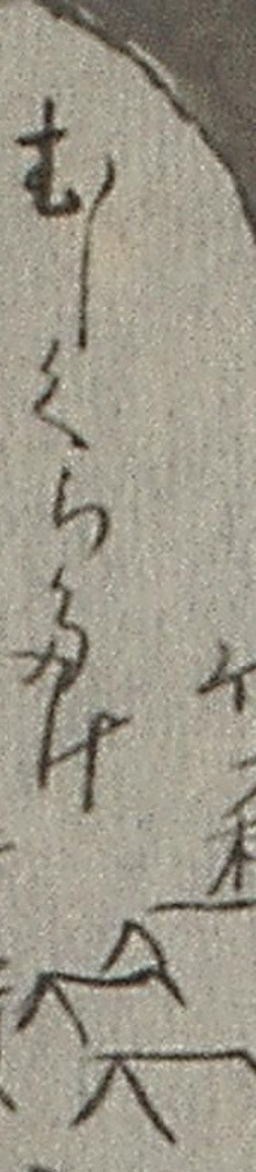むしくらたけ
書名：天明三年癸卯六月　沙降記　［蕗原拾続巻之五十二］
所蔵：東京大学地震研究所図書室 Earthquake Research Institute Library, The University of Tokyo, JAPAN
